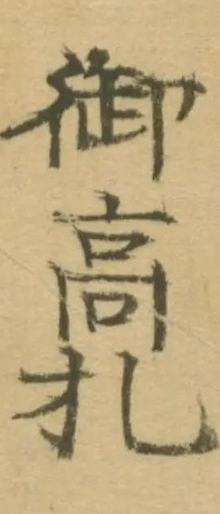御高札
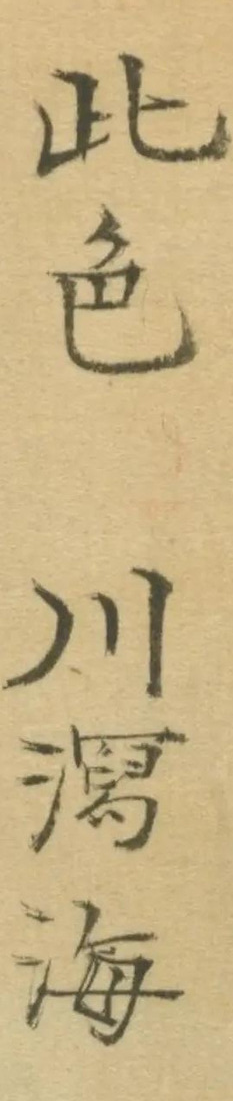此色川瀉海
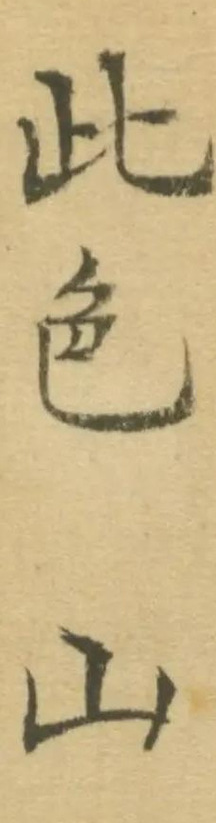此色山
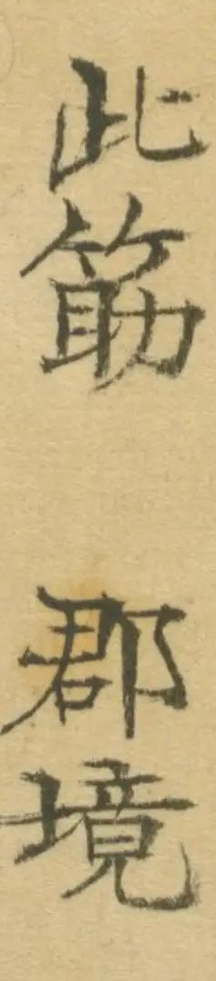此筋郡境
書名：加能越三州海邊筋村建等分間繪圖
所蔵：国立国会図書館 National Diet Library, JAPAN
